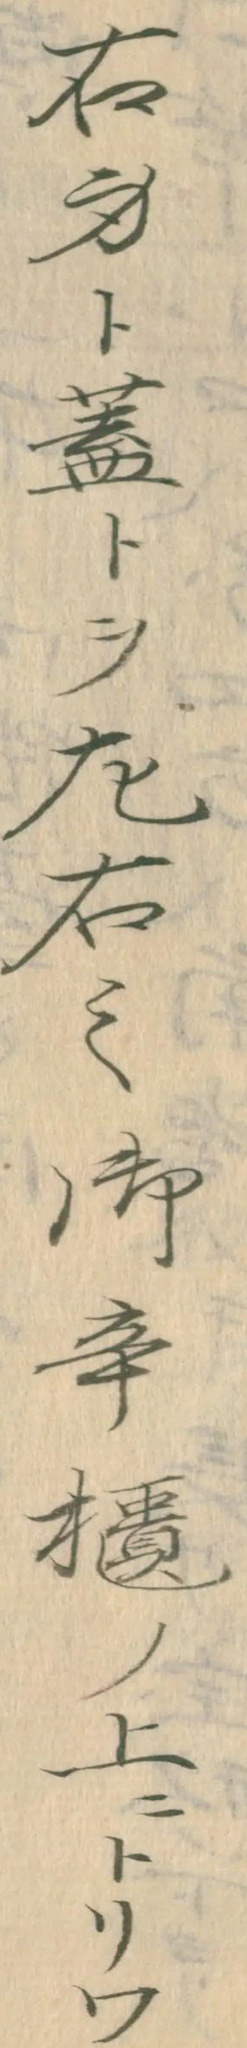右身ト蓋トヲ左右之御辛櫃ノ上ニトリワ
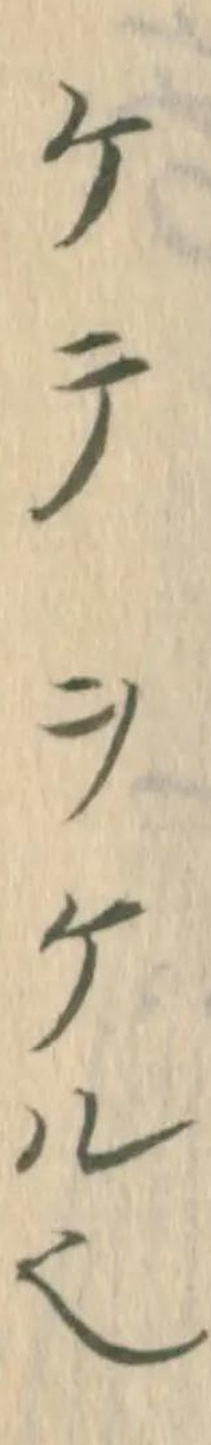ケテヲケル也
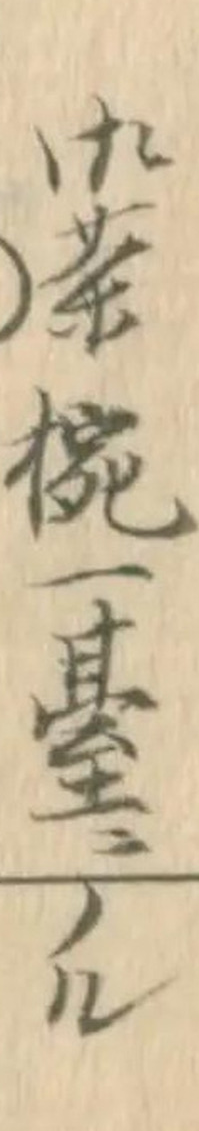御茶碗一台ニノル
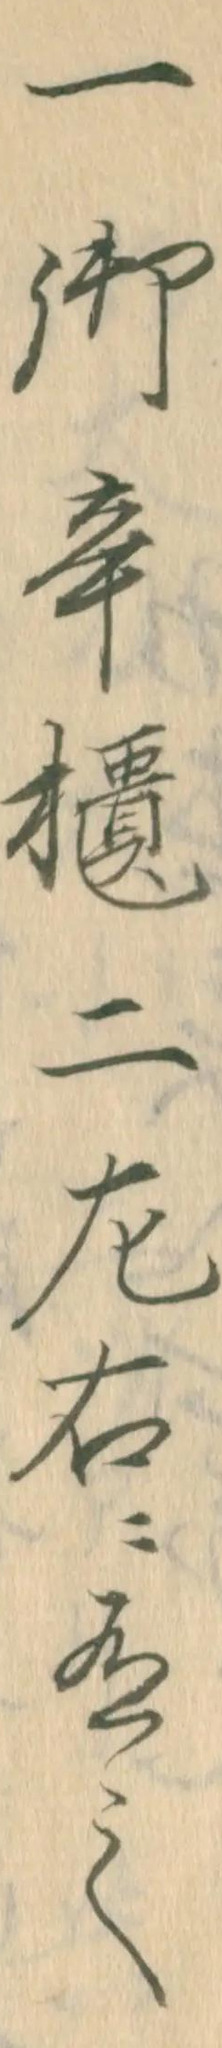一御辛櫃二左右ニ有之
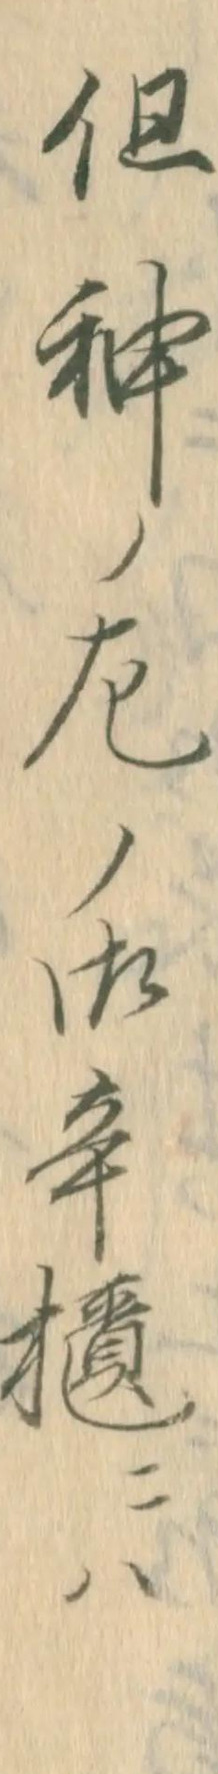但神ノ左ノ御辛櫃ニハ

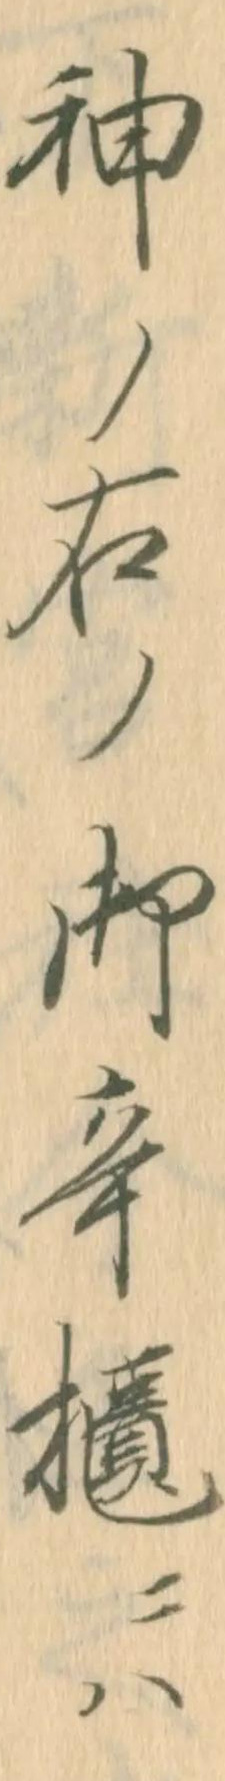神ノ右ノ御辛櫃ニハ
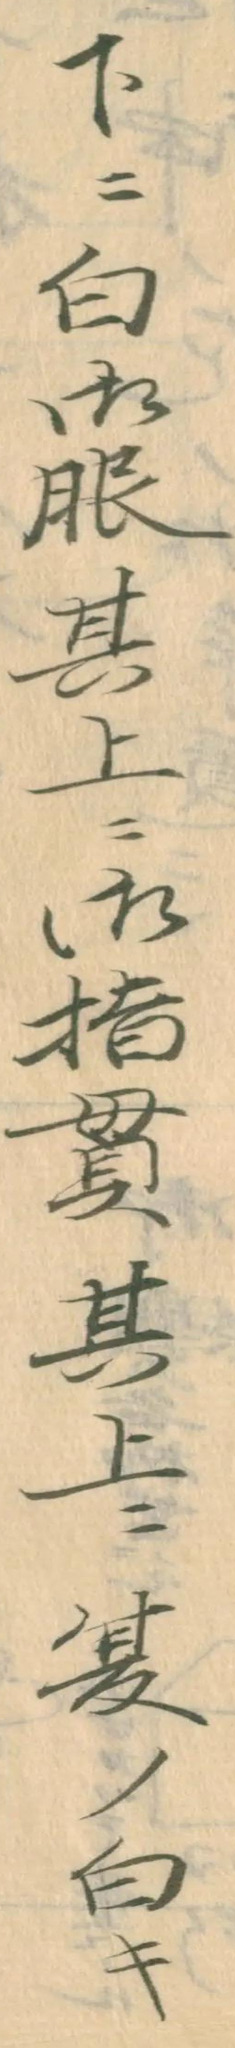下ニ白御服其上ニ御指貫其上ニ夏ノ白キ
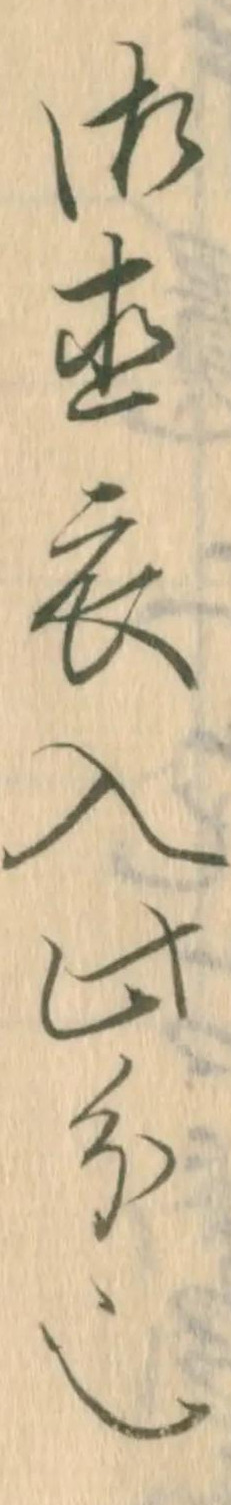御直衣入此分也
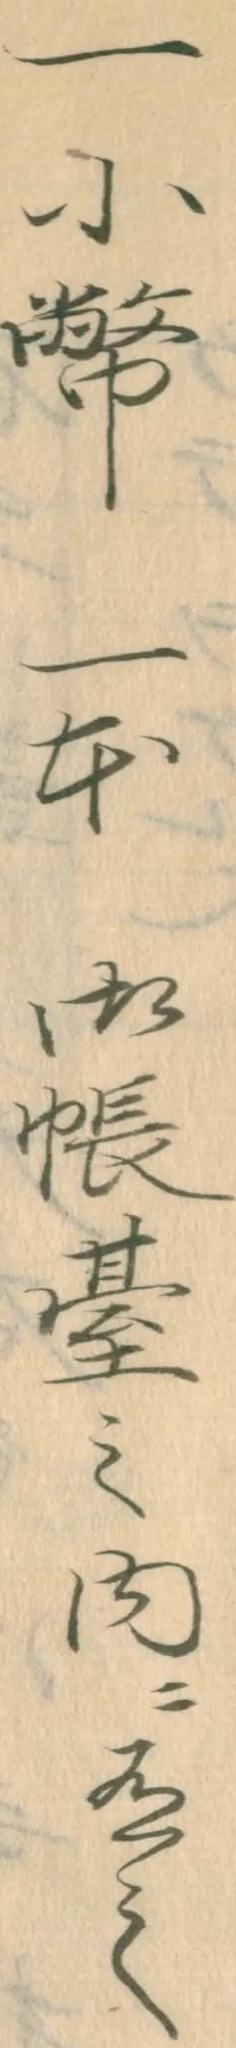一小幣一本御帳台之内ニ有之
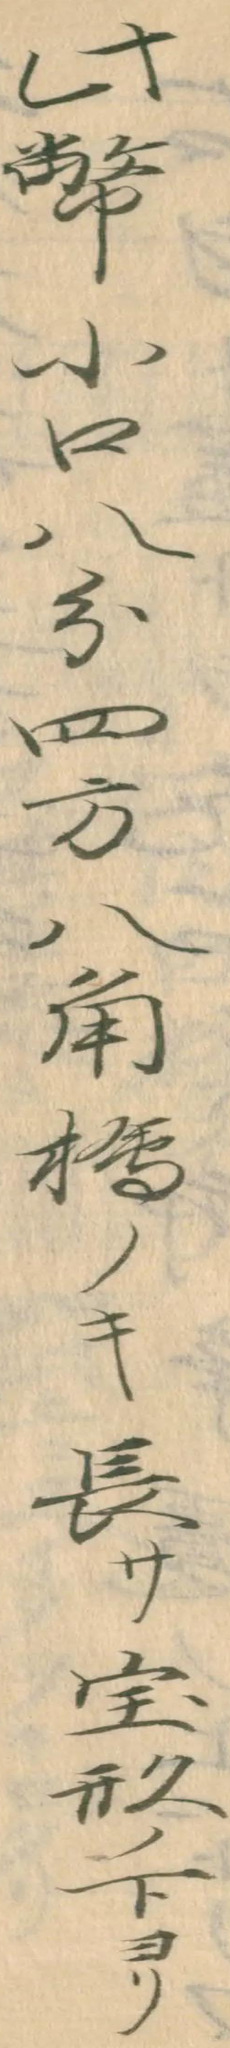此幣小口八分四方八角檜ノキ長サ宝形ノ下ヨリ
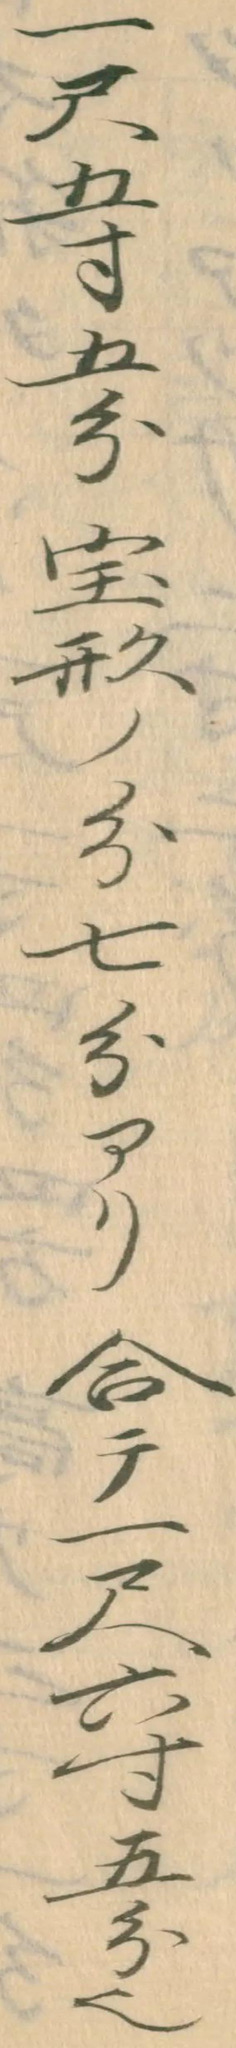一尺五寸五分宝形ノ分七分アリ合テ一尺六寸五分也
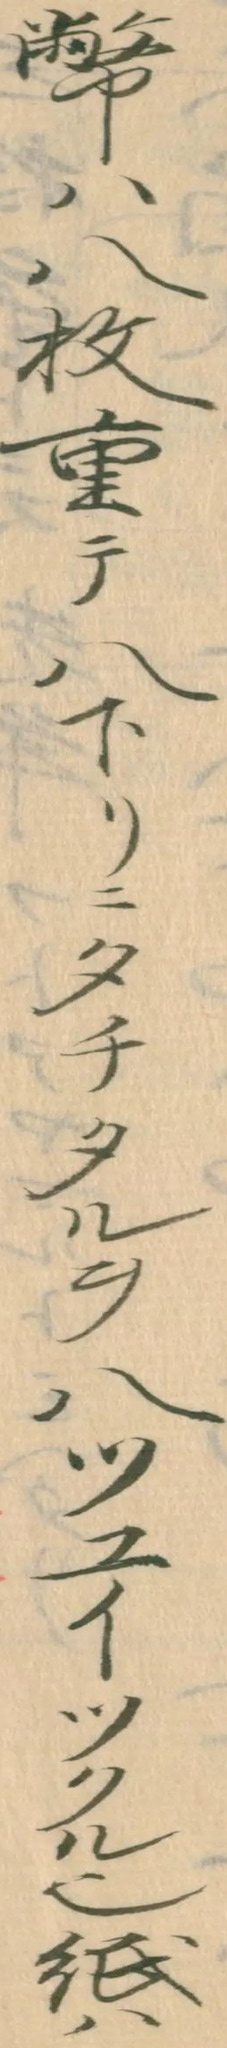幣ハ八枚重テ八下リニタチタルヲ八ツユイツクル也紙ハ
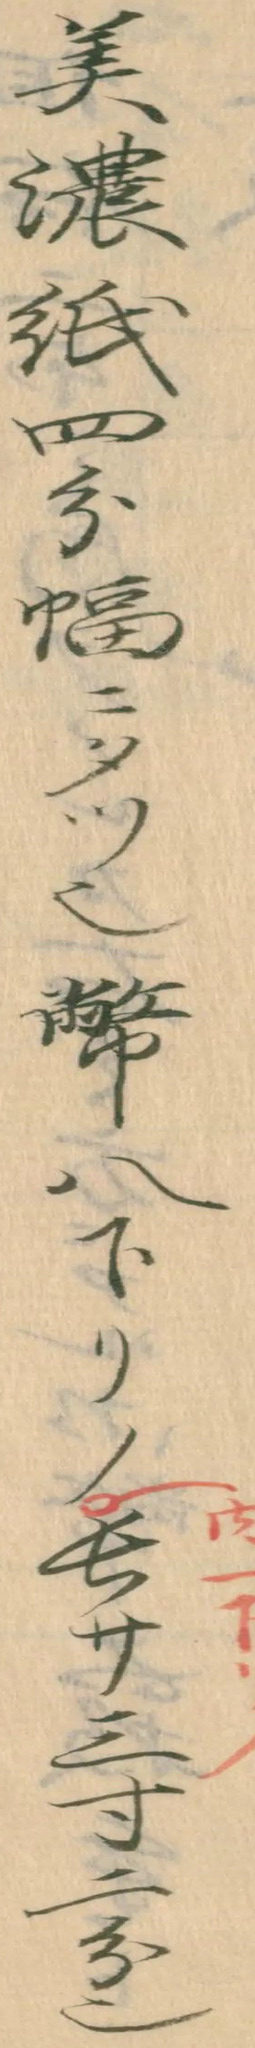美濃紙四分幅ニタツ也幣八下リノ￮長サ三寸二分也
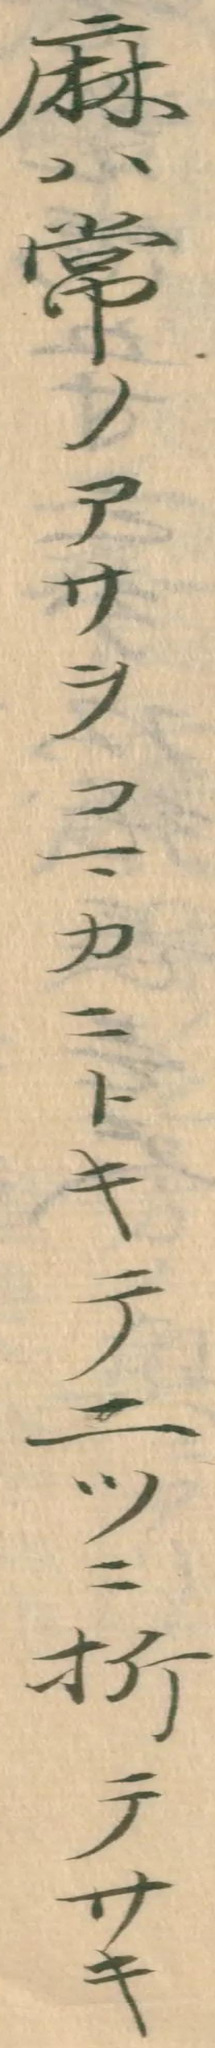麻ハ常ノアサヲコマカニトキテ二ツニ折テサキ
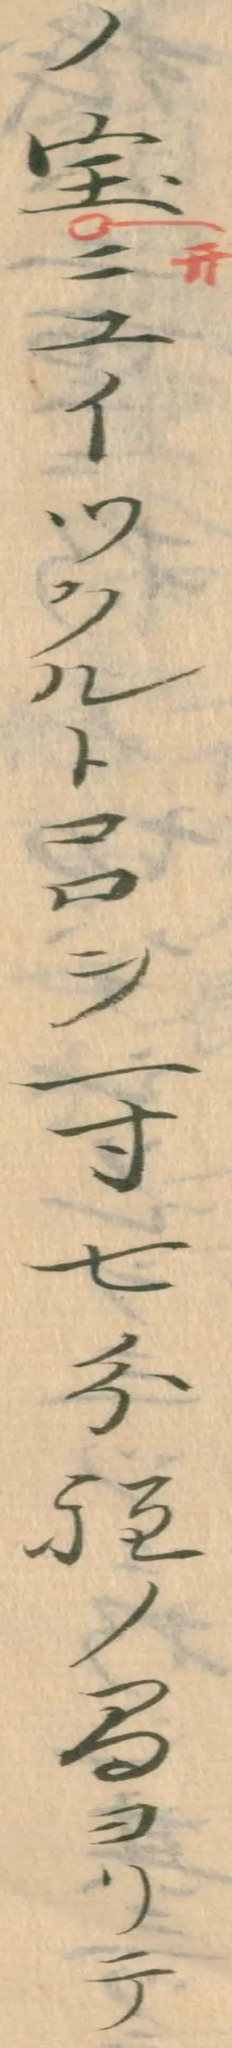ノ宝￮ニユイツクルトコロヲ一寸七分程ノ間ヨリテ
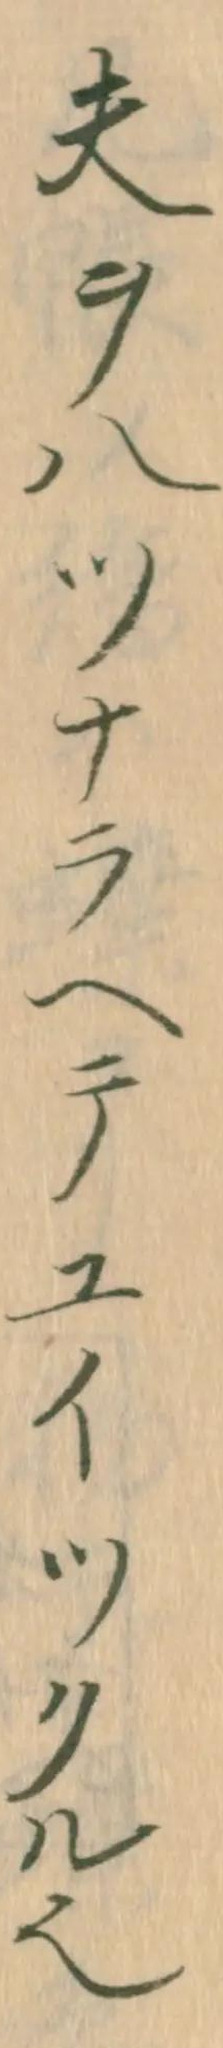夫ヲ八ツナラヘテユイツクル也
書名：賀茂社記録. 第15冊
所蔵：国立国会図書館 National Diet Library, JAPAN
